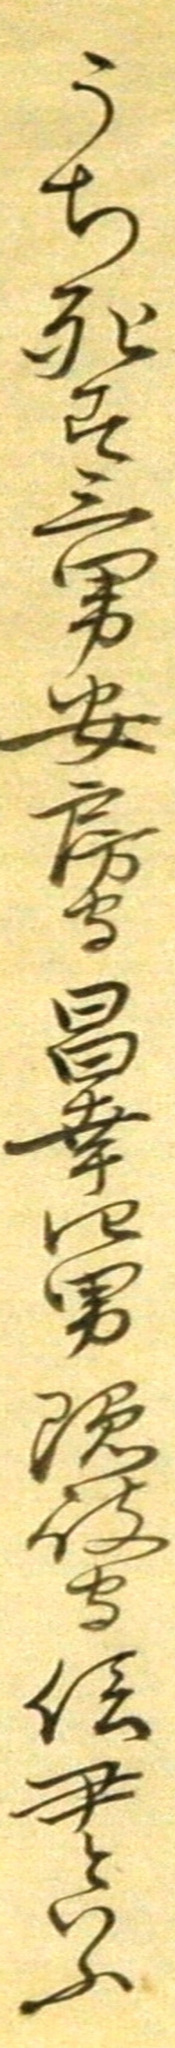うち死す三男安房守昌幸四男隠岐守信尹といふ
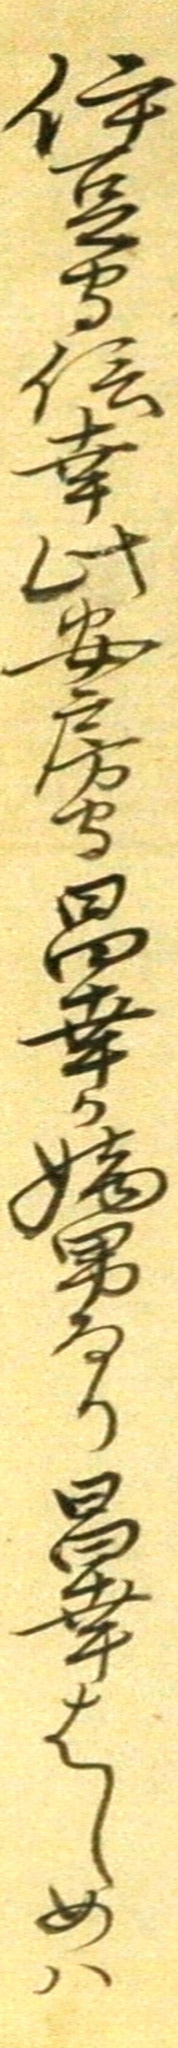伊豆守信幸此安房守昌幸か嫡男なり昌幸はしめは
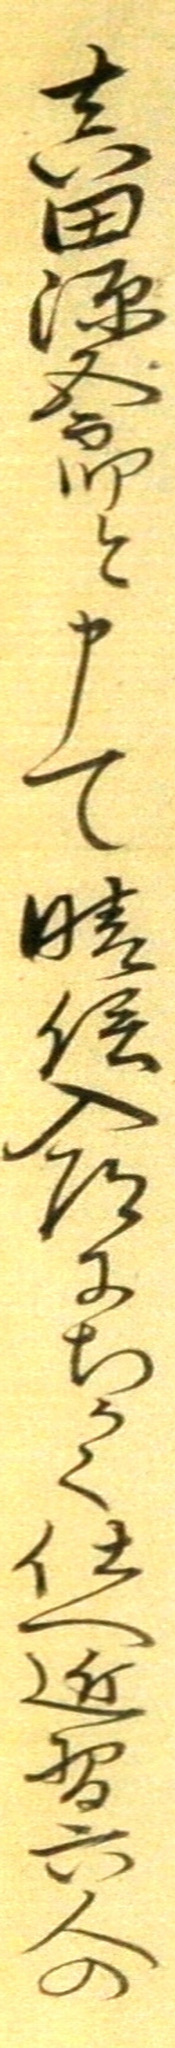真田源五郎と申て晴信入道にちかく仕へ近習六人の

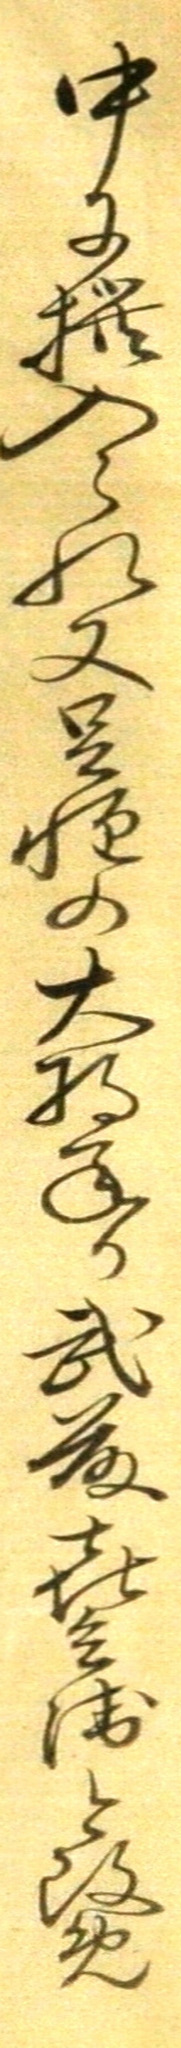中に撰入られ又足軽の大将承り武藤喜兵衛と改め
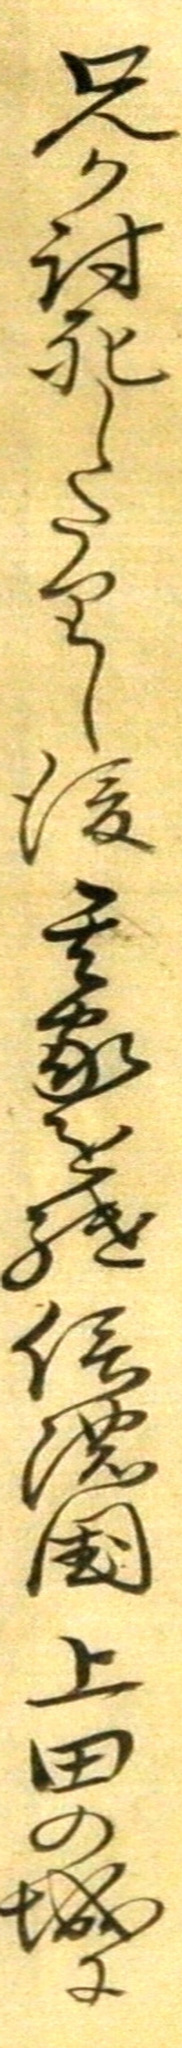兄か討死したりし後其家を継信濃国上田の城に
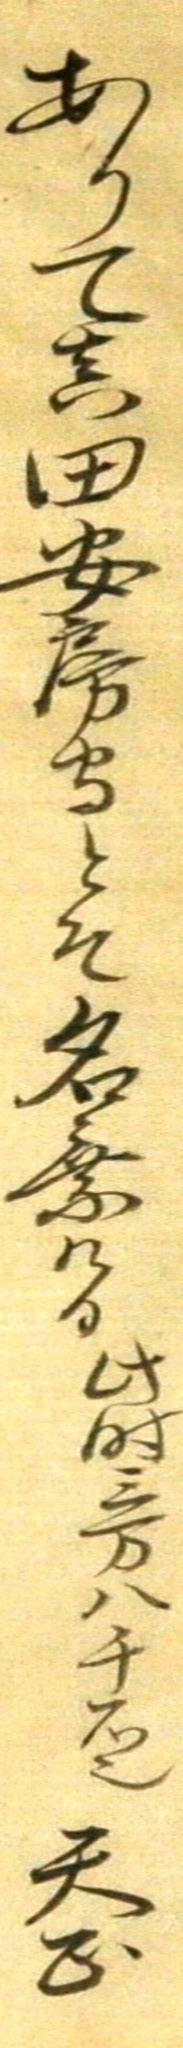ありて真田安房守とそ名乗ける此時三万八千石也天正
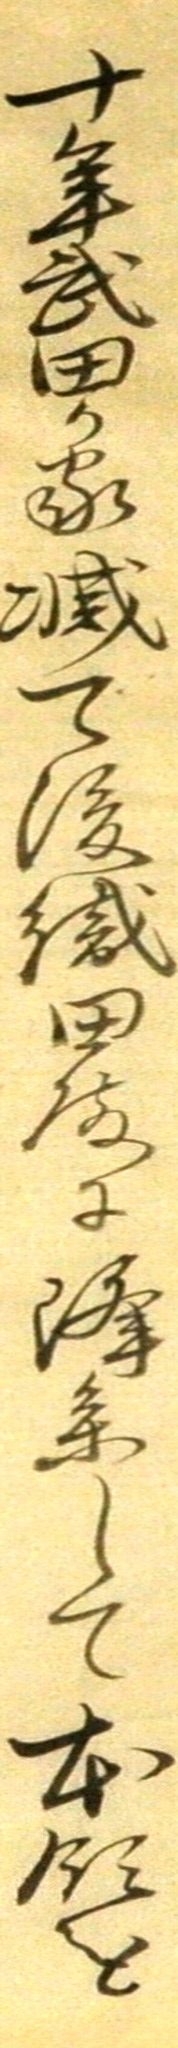十年武田か家滅て後織田殿に降参して本領を
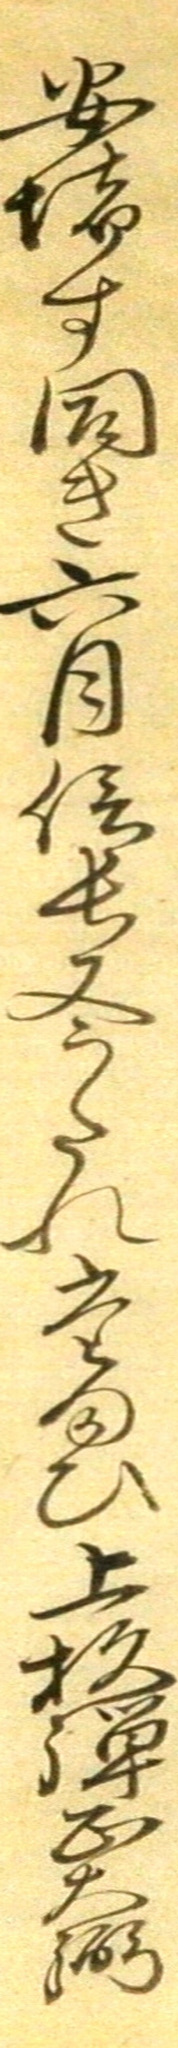安堵す同き六月信長又うたれたまひ上杉弾正大弼
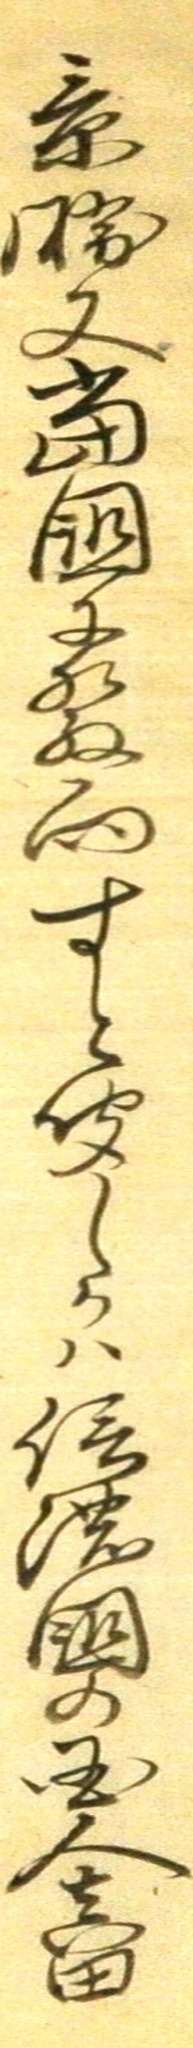景勝又東国に発向すと聞しかは信濃国の国人真田
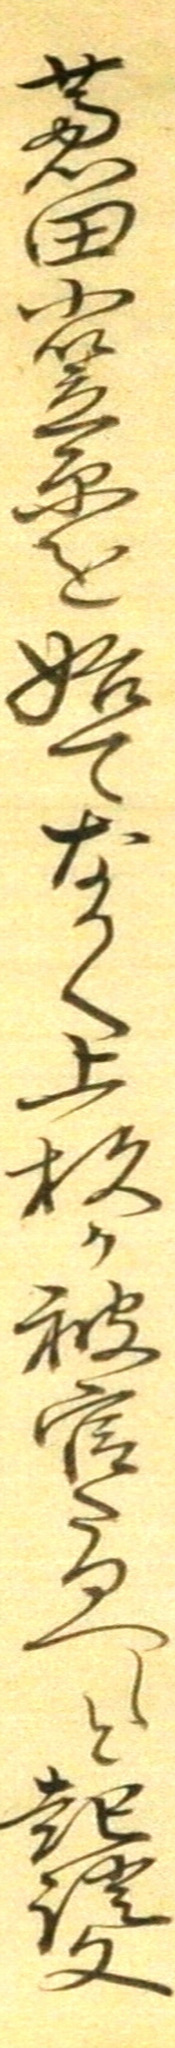芦田小笠原を始てなかく上杉か被官たるへしと起証文
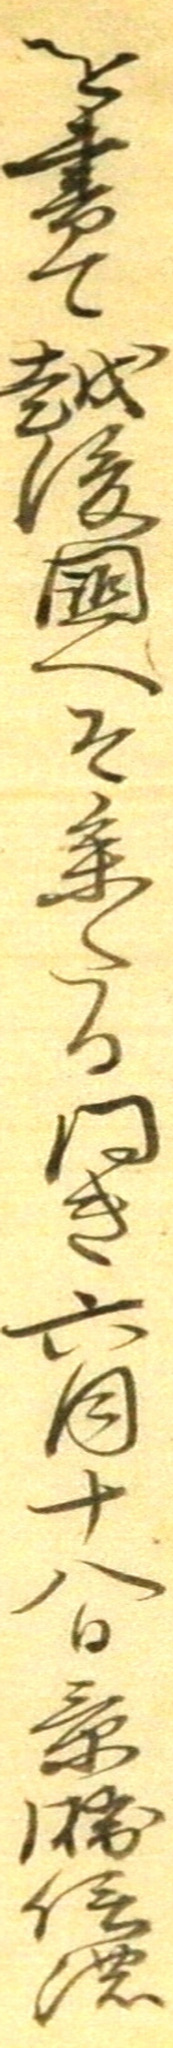を書て越後国へそ参たる同き六月十八日景勝信濃
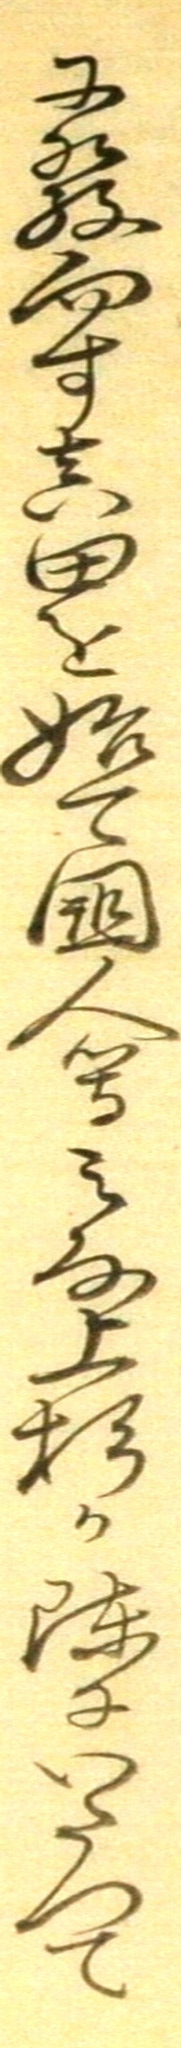に発向す真田を始て国人等みな上杉か陣にいたつて
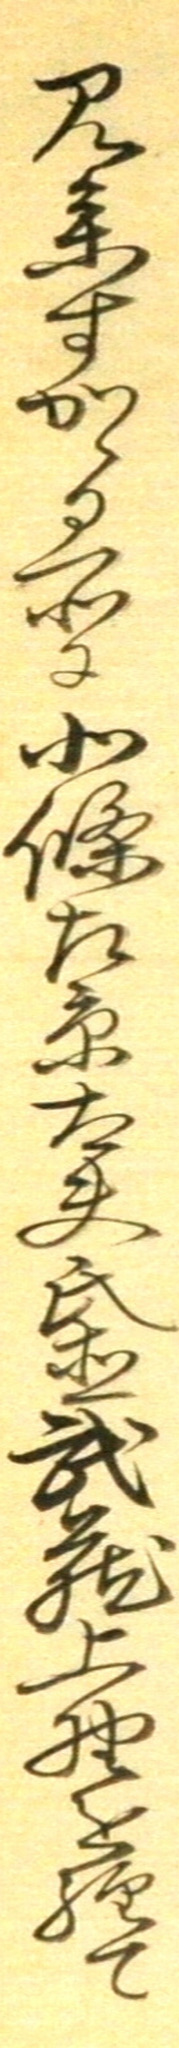見参すかゝる所に北条左京大夫氏直武蔵上野を経て
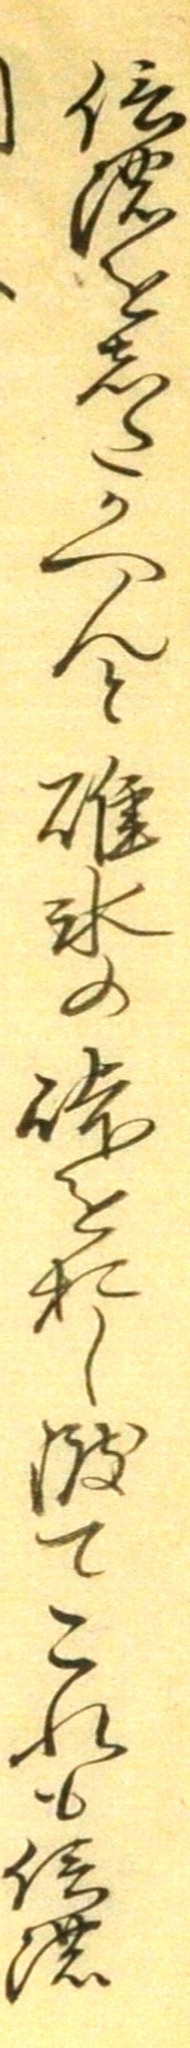信濃をしたかへんと碓氷の峠をおし渡てこれも信濃
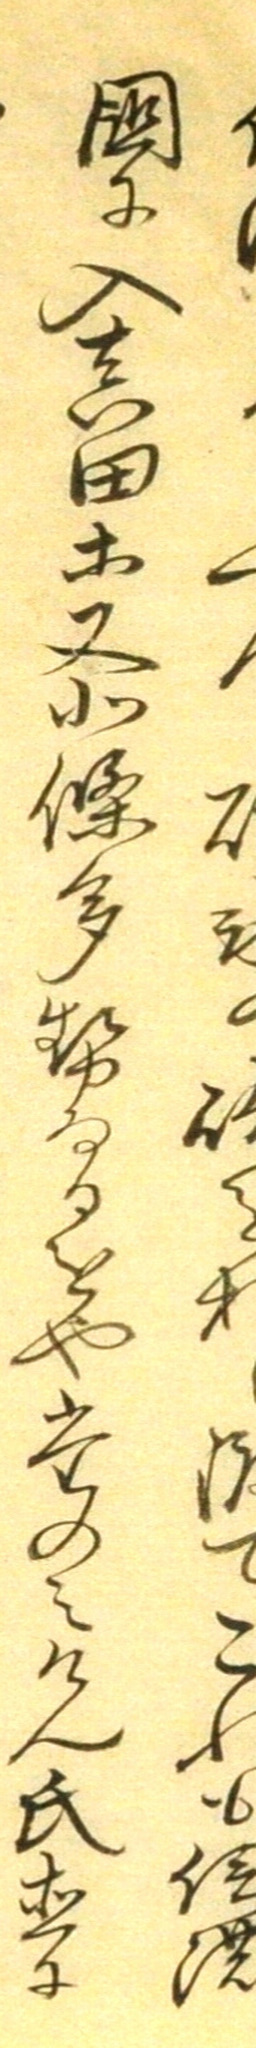国に入真田等又北条多勢なるをやたのみけん氏直に
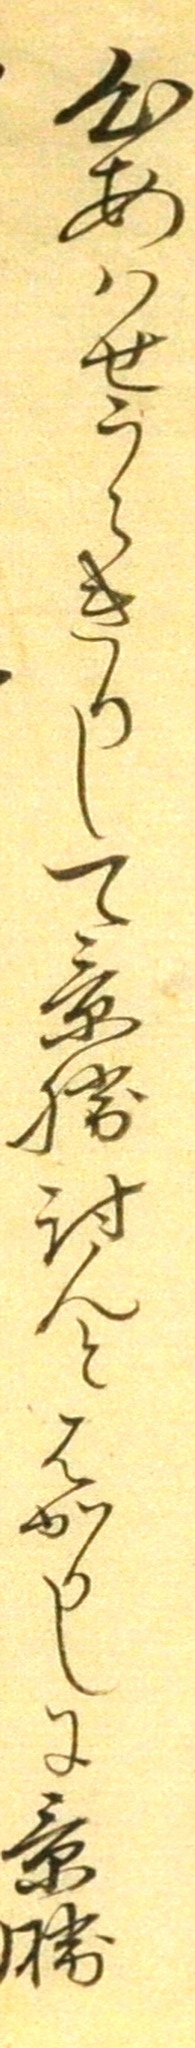心あはせうらきりして景勝討んとはかりしに景勝
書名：藩翰譜（九・上）
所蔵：伊那市立高遠町図書館・合同会社AMANE
